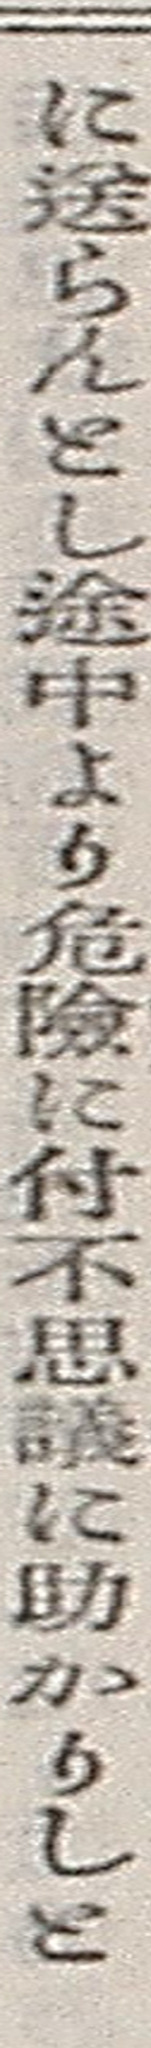に送らんとし途中より危険に付不思議に助かりしと
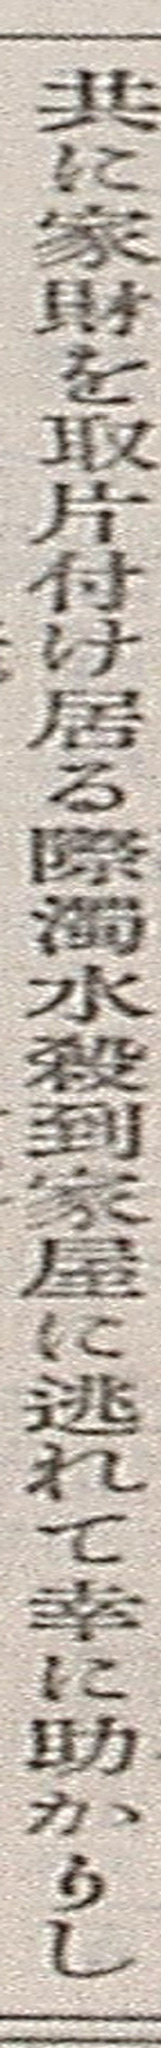共に家財を取方付け居る際濁水殺到家屋に逃れて幸に助かりし
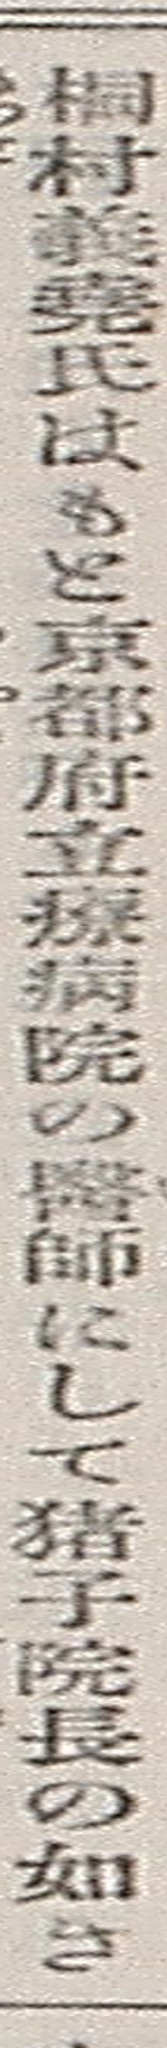桐村義堯氏はもと京都府立療病院の医師にして猪子院長の如き
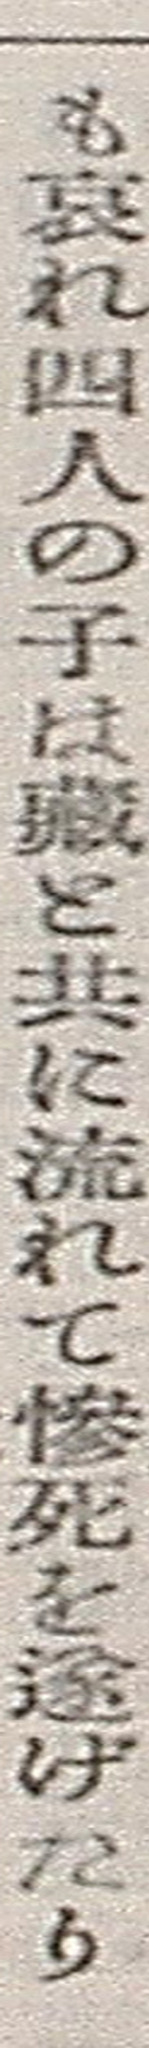も哀れ四人の子は蔵と共に流れて惨死を遂げたり
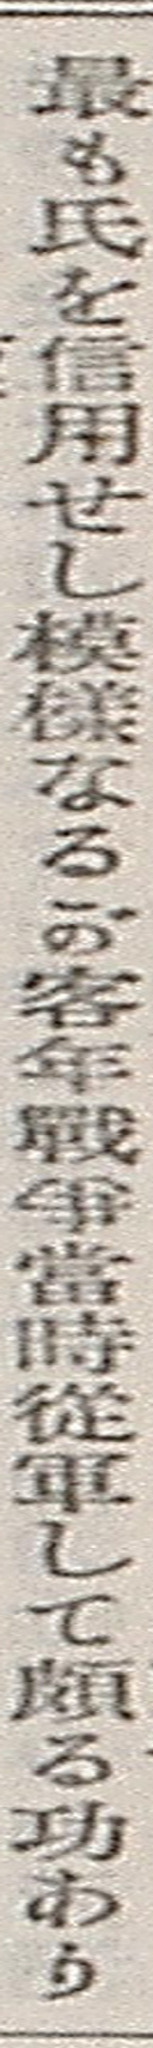最も氏を信用せし模様なるが客年戦争当時従軍して頗る功あり
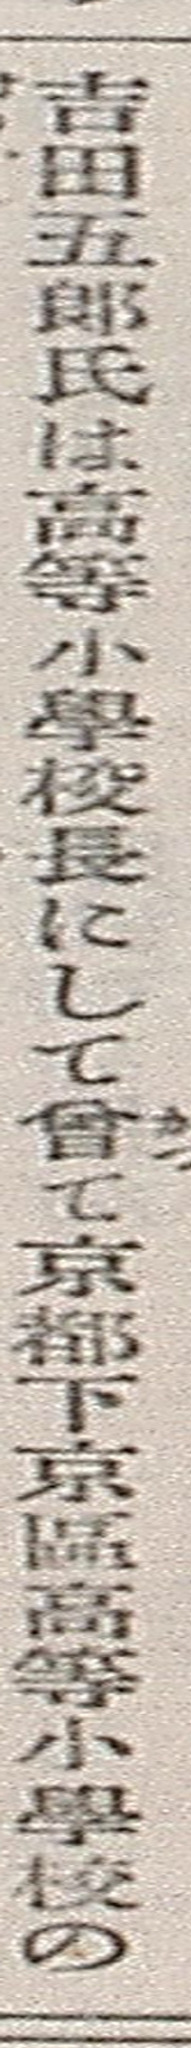吉田五郎氏は高等小学校長にして曾て京都下京區高等小学校の
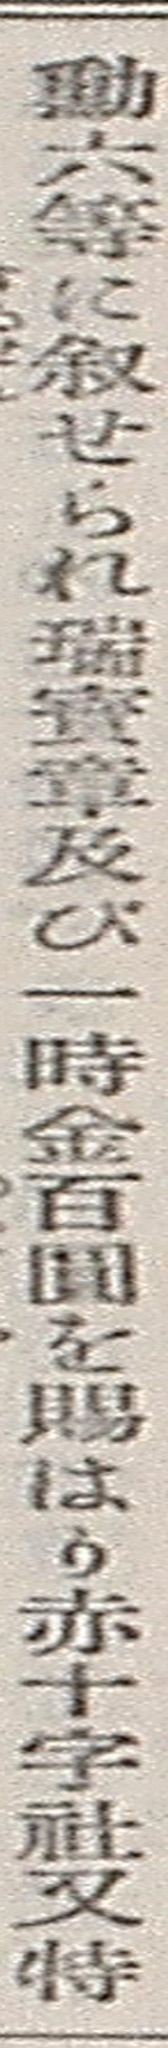勳六等に叙せられ瑞宝章及び一時金百円を賜はり赤十字社又特
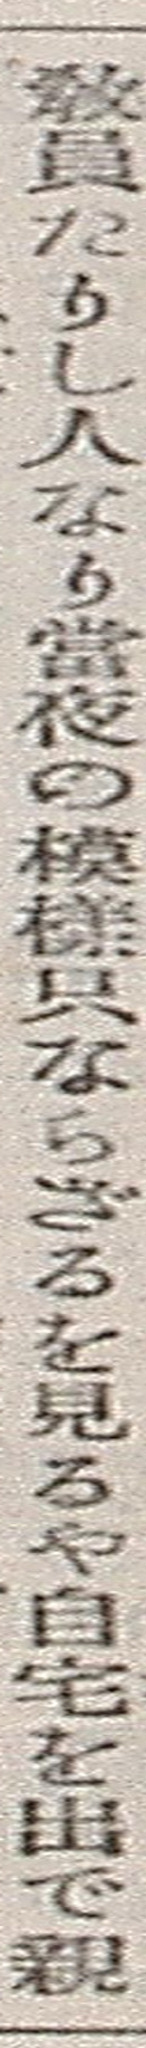教員たりし人なり当夜の模様只ならざるを見るや自宅を出て親
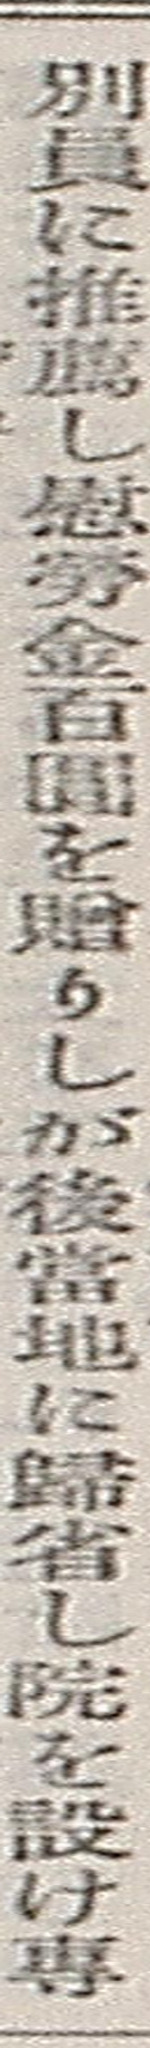別員に推薦し慰労金百円を贈りしが後当地に帰省し院を設け専
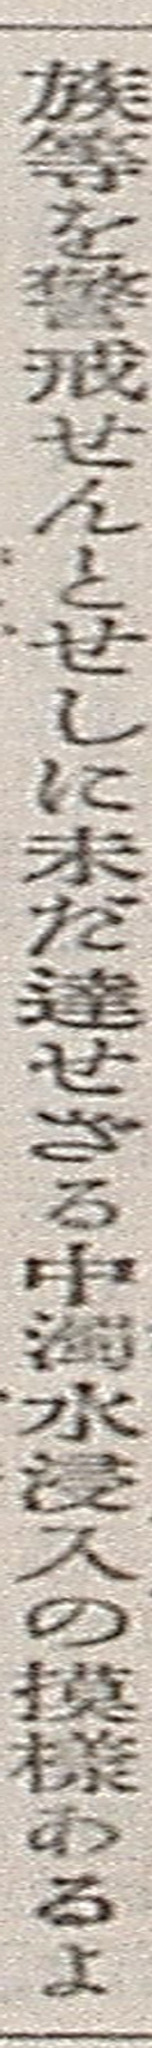族等を警戒せんとせしに未だ達せざる中濁水侵入の模様あるよ
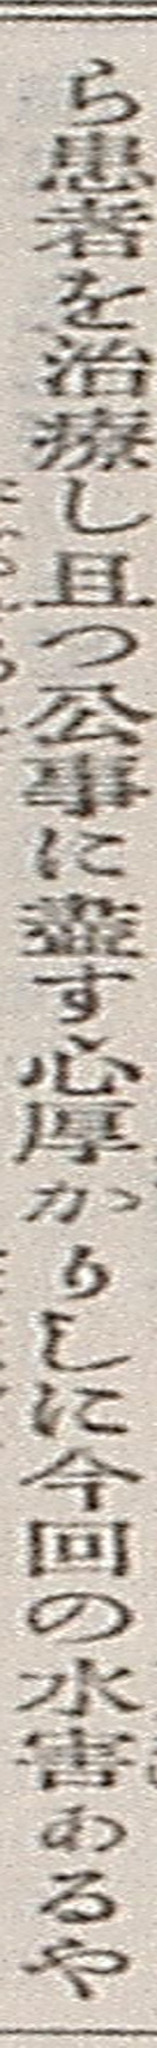ら患者を治療し且つ公事に盡す心厚かりしに今回の水害あるや
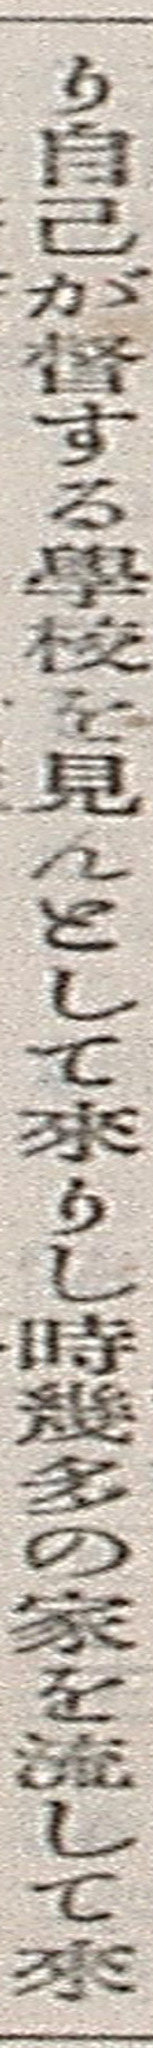り自己が督する学校を見んとして来りし時幾多の家を流して来
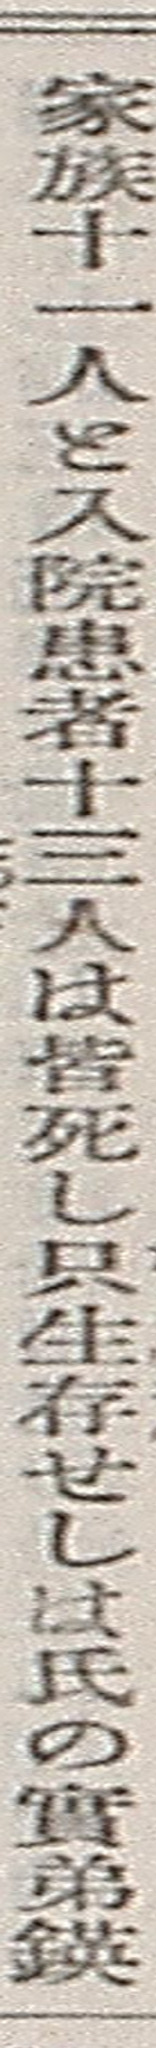家族十一人と入院患者十三人は皆死し只生存せしは氏の実弟
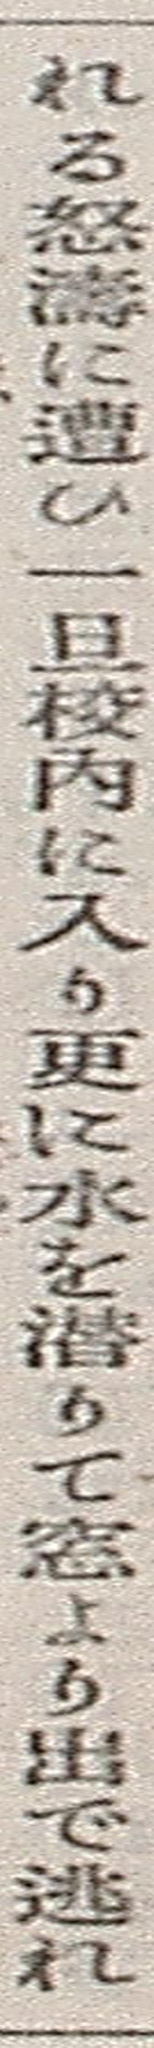れる怒濤に遭ひ一旦校内に入り更に水を潜りて窓より出で逃れ
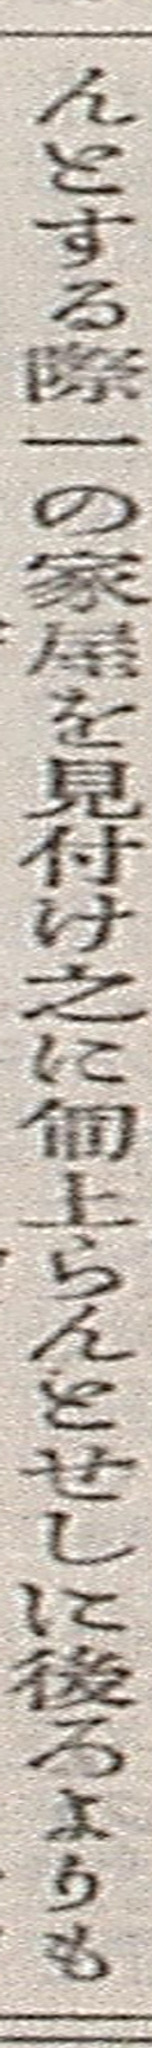んとする際の家屋を見付け之に匍上らんとせしに後ろよりも
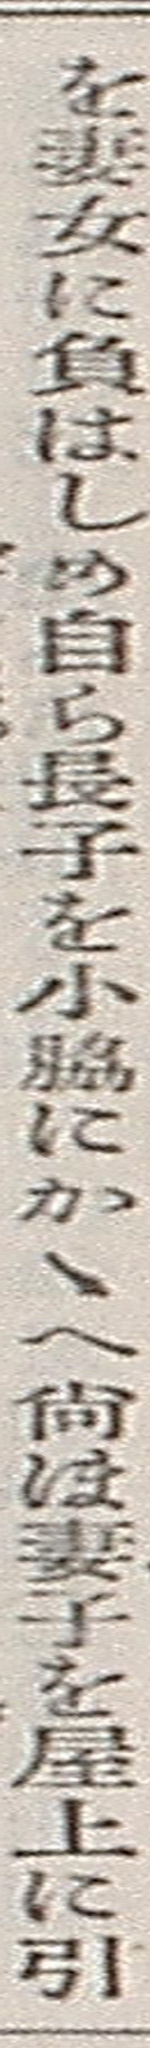を妻女に負はしめ自ら長子を小脇にかゝへ尚ほ妻子を屋上に引
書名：風俗畫報臨時増刊第百二十六號　洪水被害録（中）
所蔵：東京大学地震研究所図書室 Earthquake Research Institute Library, The University of Tokyo, JAPAN
